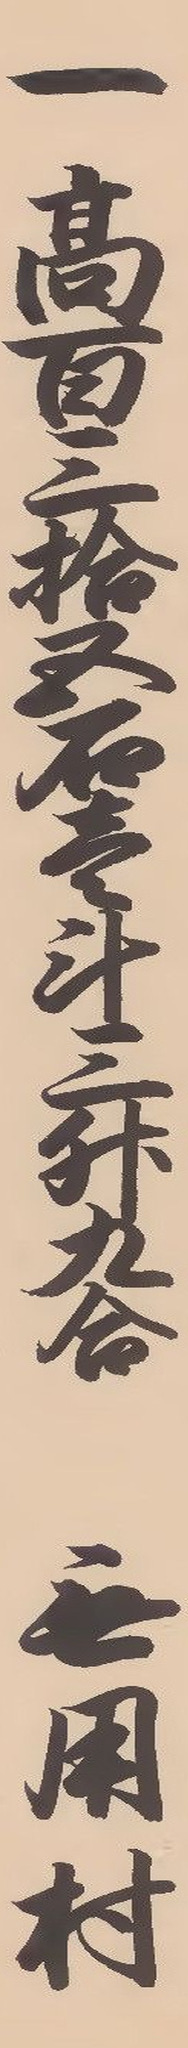一高百三拾五石壱斗三升九合無用村
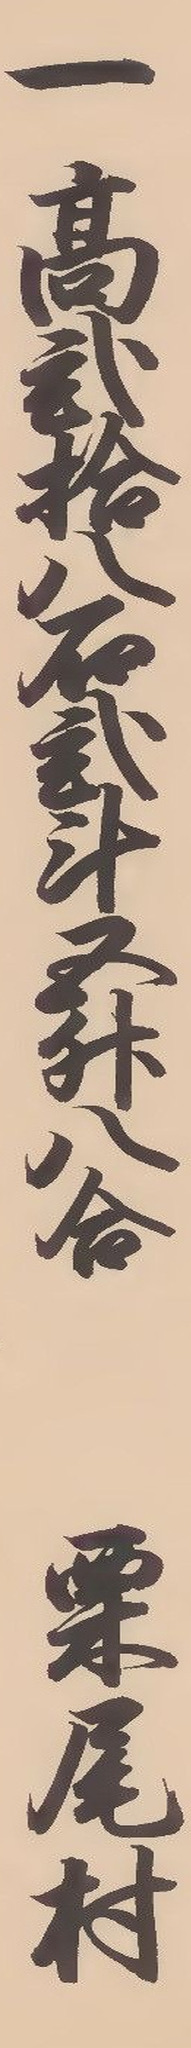一高弐拾八石弐斗五升八合栗尾村

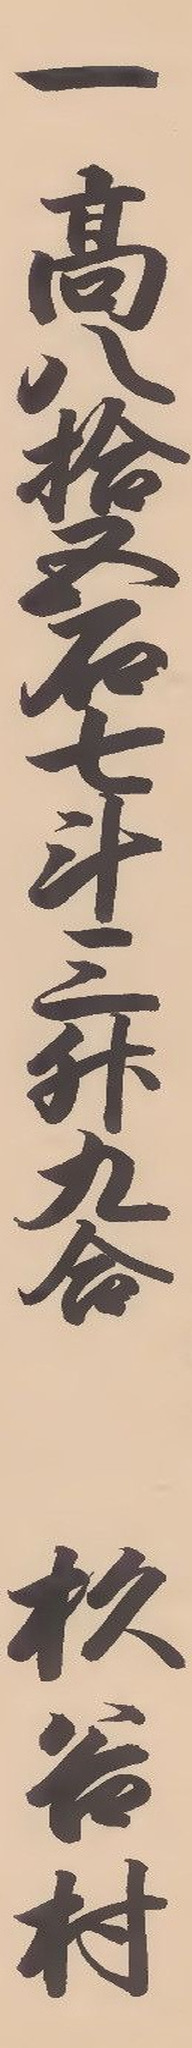一高八拾五石七斗三升九合杉谷村
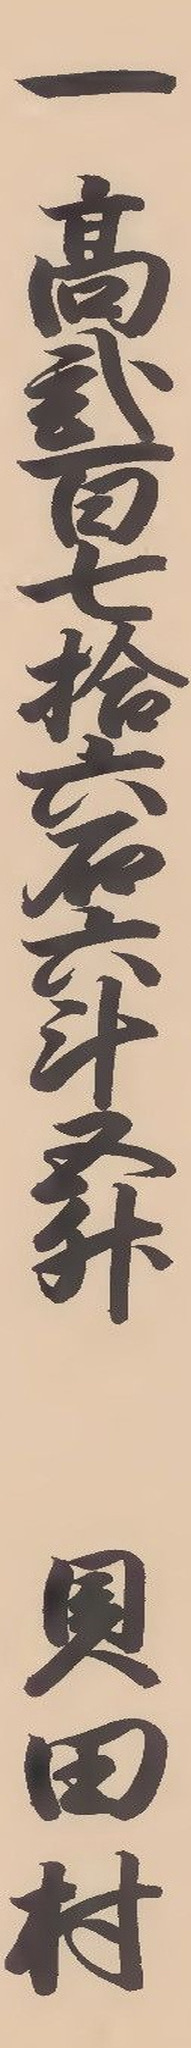一高弐百七拾六石六斗五升貝田村
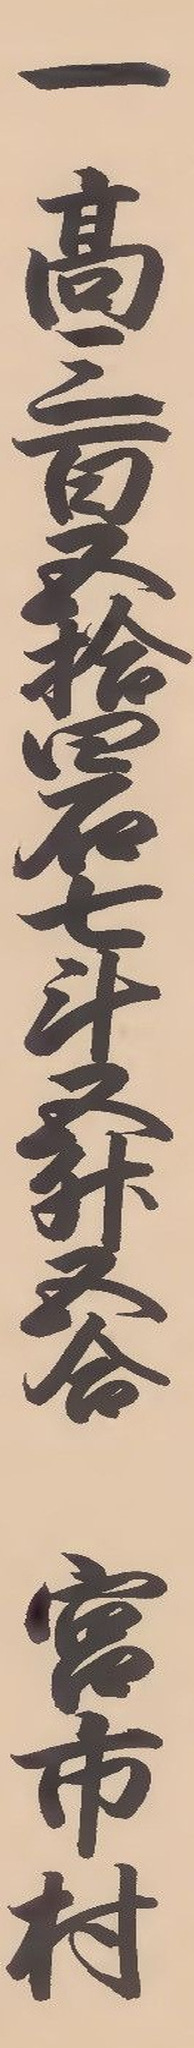一高三百五拾四石七斗五升五合宮市村
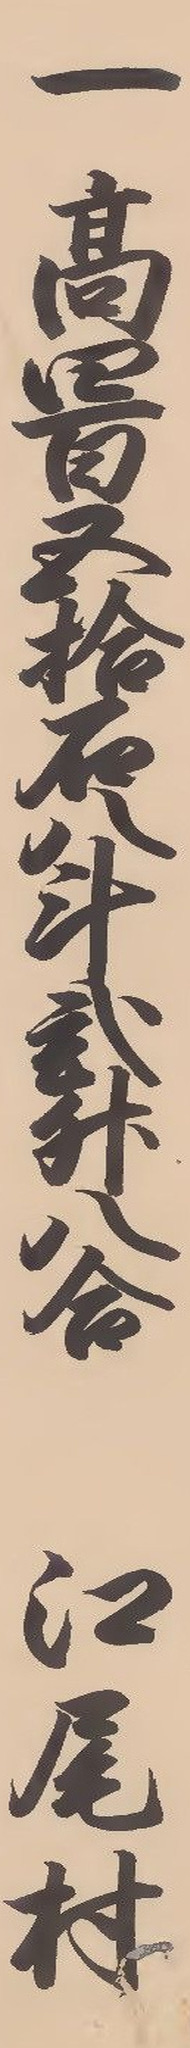一高四百五拾石八斗弐升八合江尾村
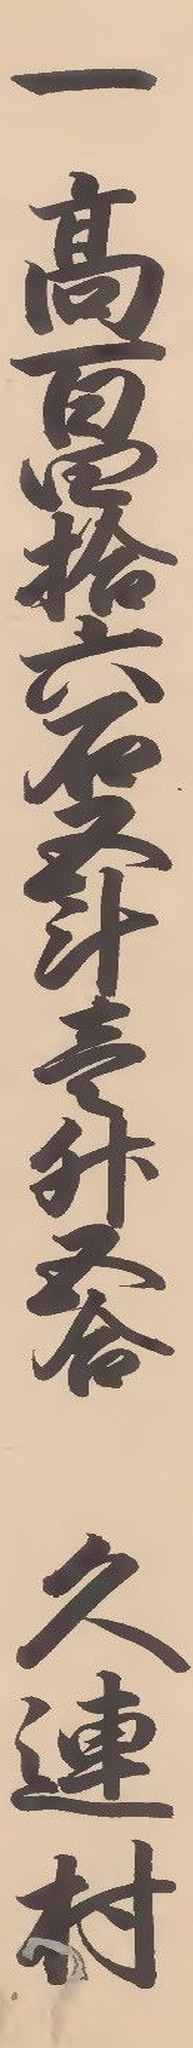一高百四拾六石五斗壱升五合久連村
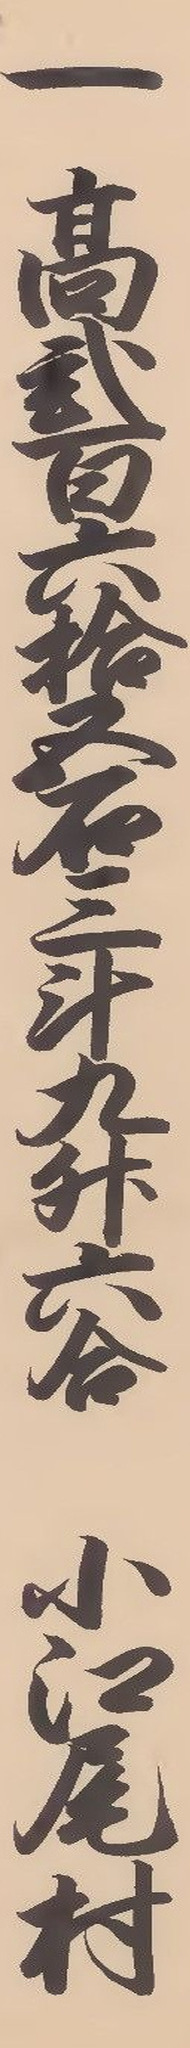一高弐百六拾五石三斗九升六合小江尾村
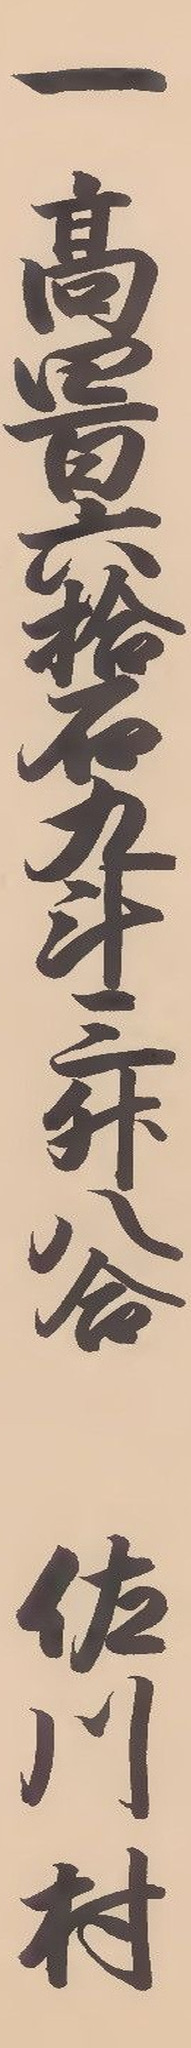一高四百六拾石九斗三升八合佐川村
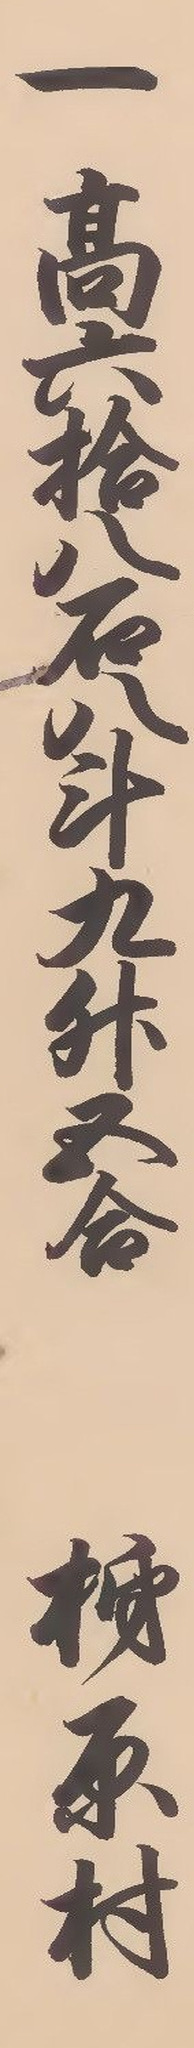一高六拾八石八斗九升五合柿原村

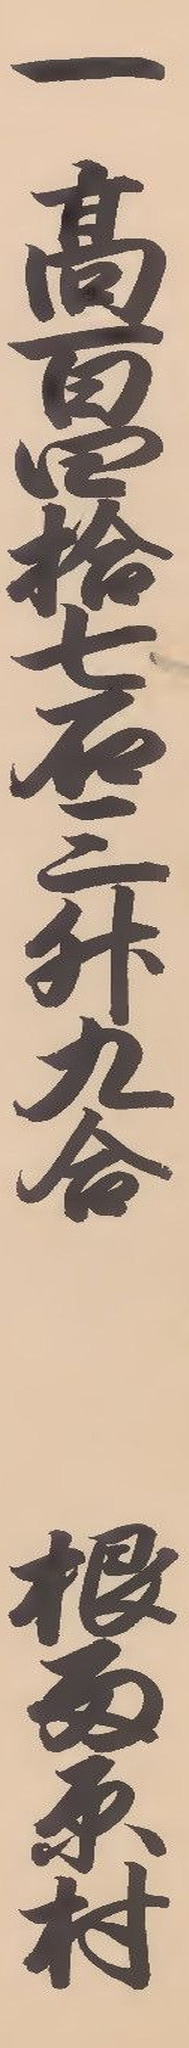一高百四拾七石三升九合根雨原村
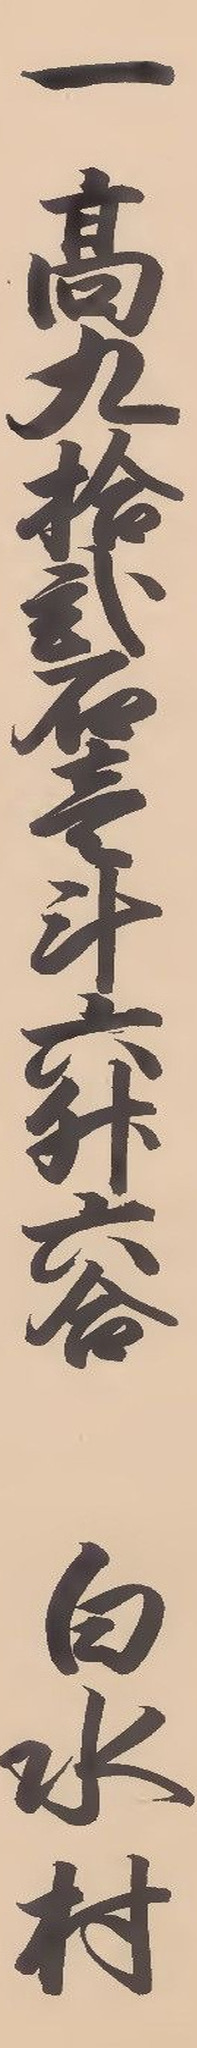一高九拾弐石壱斗六升六合白水村
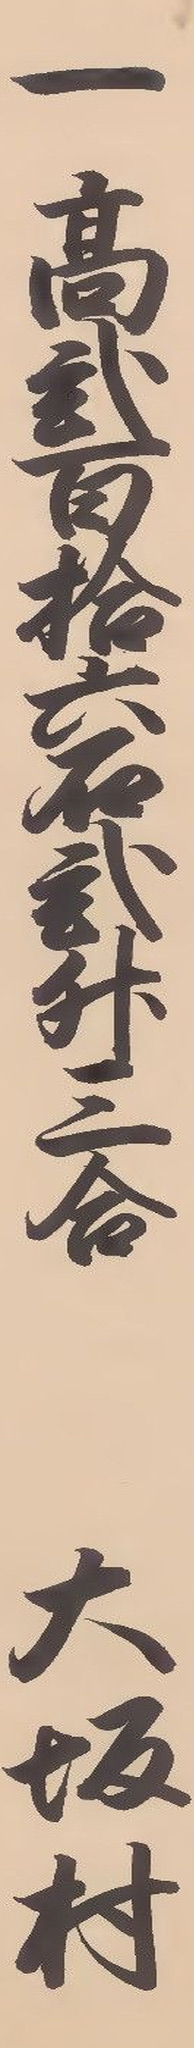一高弐百拾六石弐升三合大坂村
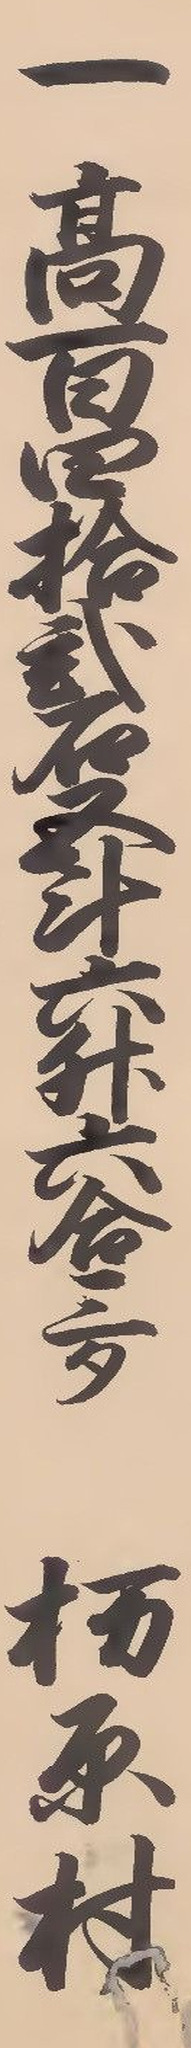一高百四拾弐石五斗六升六合三勺栃原村
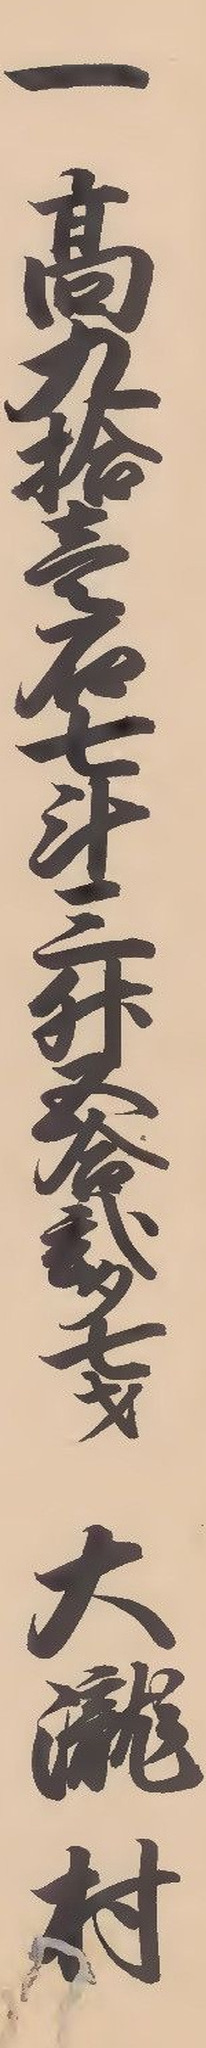一高九拾壱石七斗三升五合弐勺七才大滝村
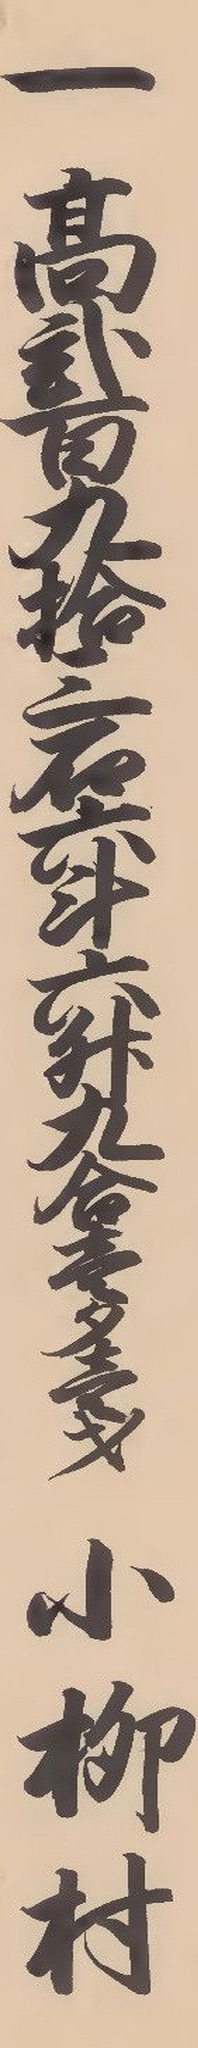一高弐百九拾三石六斗六升九合壱勺壱才小柳村
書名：伯耆国郷帳
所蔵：国立公文書館 National Archives of Japan
